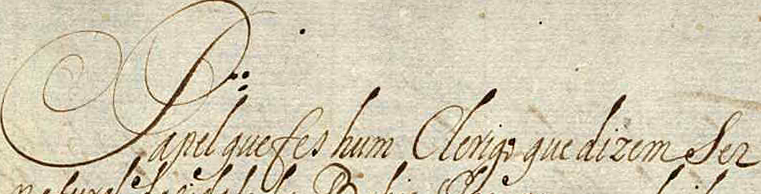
Papel que fes hum Clerigo que dizem Ser
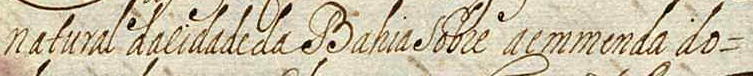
natural da cidade da Bahia sobre a emmenda do
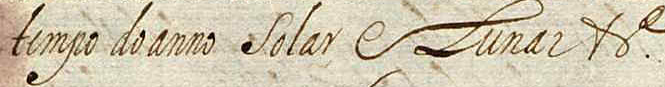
tempo do anno Solar e Lunar &r.a
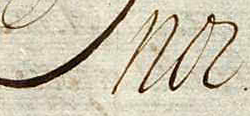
Snōr.
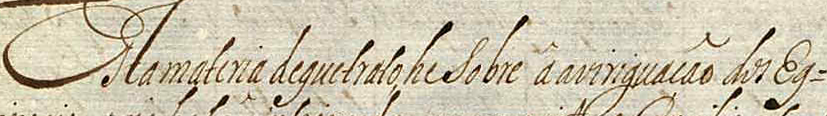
Esta materia de que trato he sobre a aviriguação dos Eq
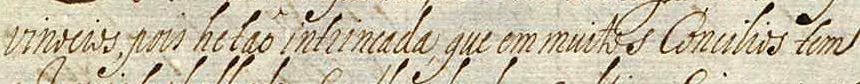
vinocios, pois he taõ intrincada, que em muitos Concilios tem
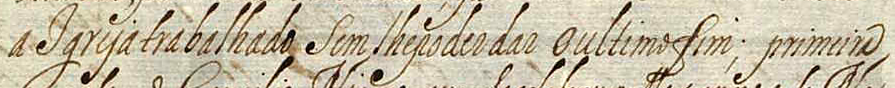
a Igreja trabalhado sem lhe poder dar o ultimo fim; primeira
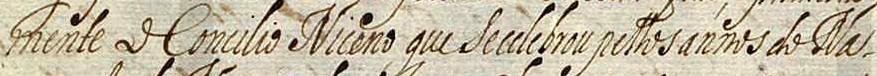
mente o Concilio Niceno que Se celebrou pellos annos do Na
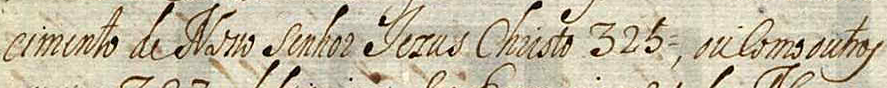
cimento de Nosso Senhor Iezus Christo 325, ou Como outros
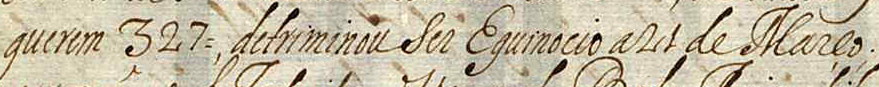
querem 327. detriminou Ser E quinocio a 21 de Março.
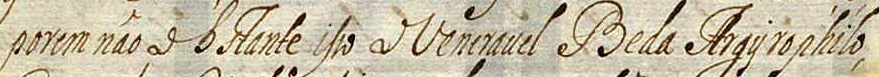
porem não obstante isso o Venerauel Beda Argyrophilo,
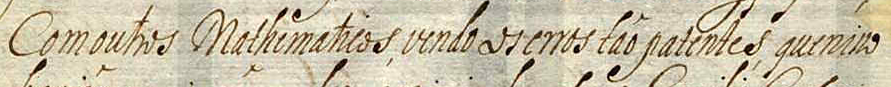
Com outros Mathematicos, vendo os erros taõ patentes que nisso
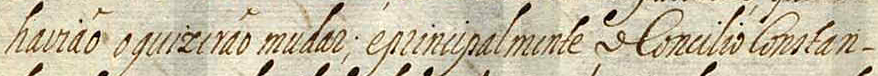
havião o quizerão mudar; e principalmente o Concilio Constan
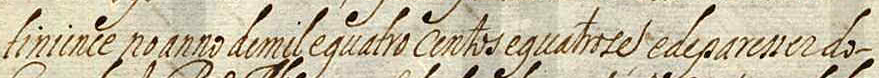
tinience no anno de mil e quatrocentos e quatroze, e de paresser do
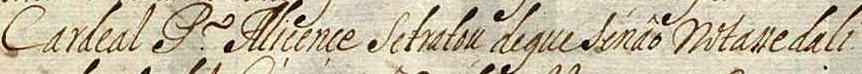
Cardeal P.o Alicence Se tratou, de que senaõ notasse dali
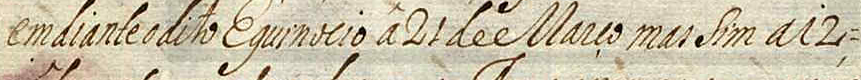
em diante o dito Equinocio â 21 de Março mas Sim a i2
